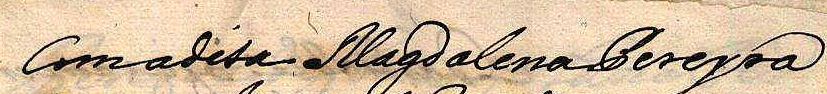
Com a dita Magdalena Pereyra
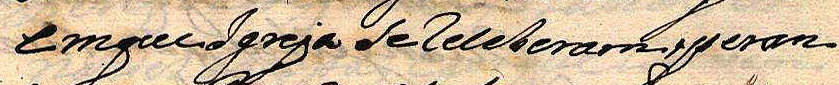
em que Igreja se Receberam, peran
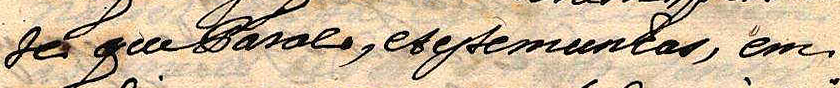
te que Paroco, e testemunhas, em
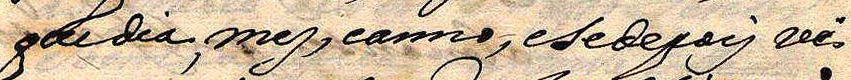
que dia, mes, e anno, e se depois vi
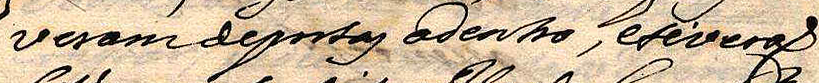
veram de portas adentro, e tiveraõ
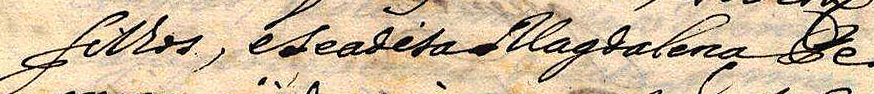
filhos, e se a dita Magdalena Pe
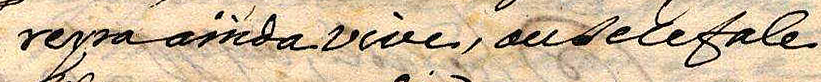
reyra ainda vive, ou se he fale
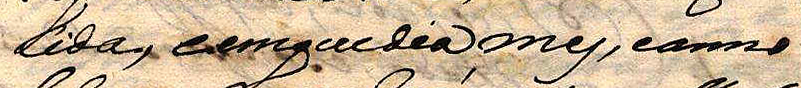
cida, e em que dia, mes, e anno
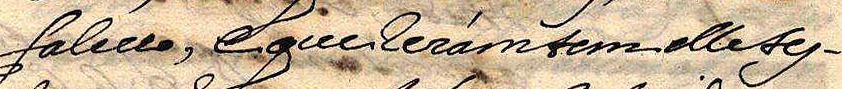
faleceo, e que Rezam tem elle tes
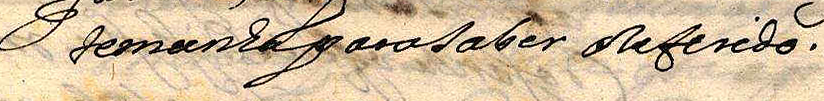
temunha para saber o Referido.
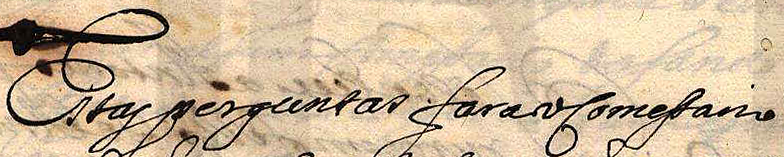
Estas perguntas fara o Comessario
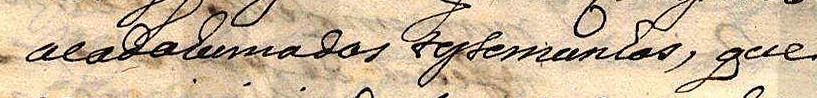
a cada huma das testemunhas, que
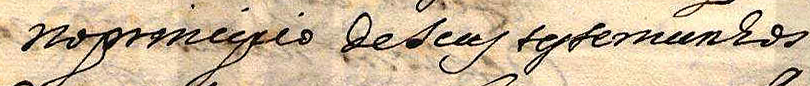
no principio de seus testemunhos
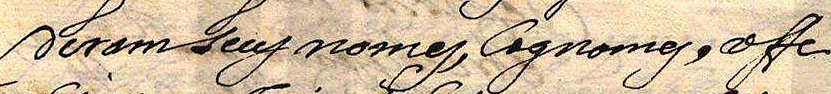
deram seus nomes, cognomes, offi
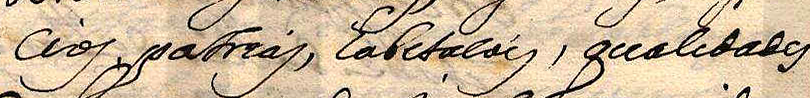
cios, patrias, habitaçoẽs, qualidades
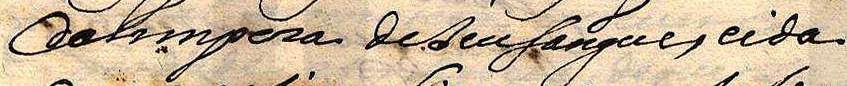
da limpeza de seu sangue, e ida
